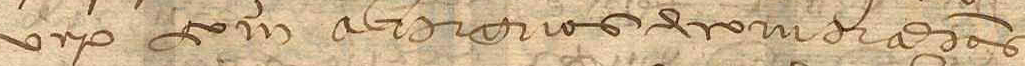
vejo com artiguos de comtradt̄as
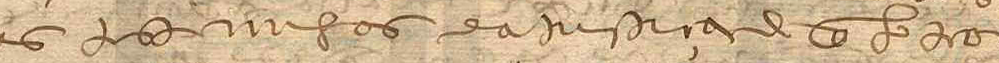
as testemuhas da Justiça de q̄ ho teor
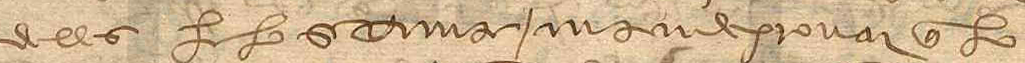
delles he ho segimte / entende prouar q̄ ho
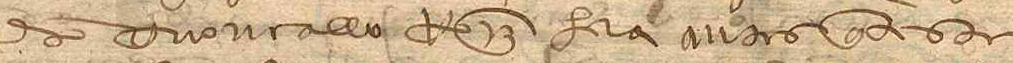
dt̄o guoncallo Rōjz hera antes q̄ teste
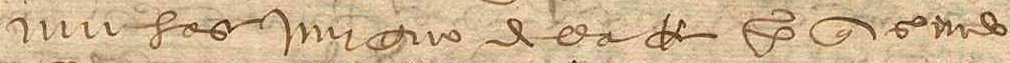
munhase Jmjguo della Re p̄oq̄ soendo
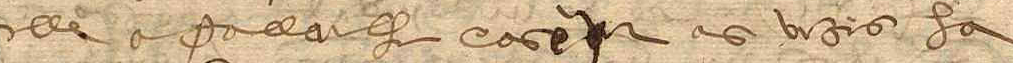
elle a fallar lhe e asy ter as vezes ha
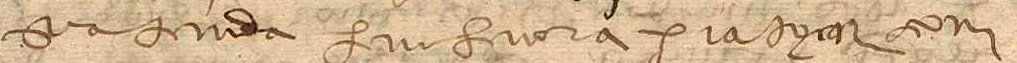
sua tenda hem heuora pratycar com
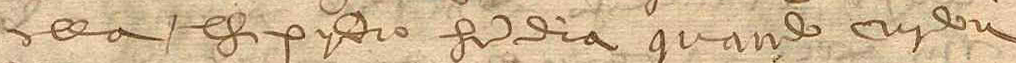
ella / lhe pydio hū dia quando cujdou
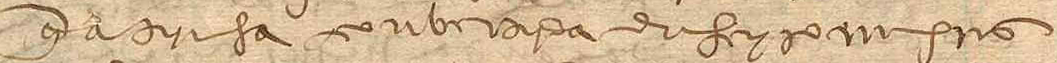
q̄ a tynha convertyda dinheyro empres
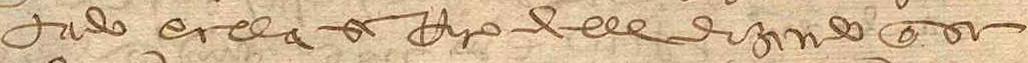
tado e ella se Ryo delle dizendo q̄ se
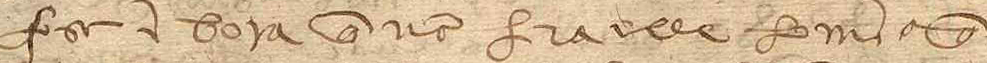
fose ē bora q̄ nā hera elle homē a q̄
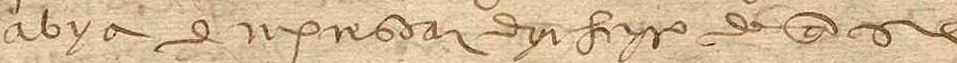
avya demprestar dynheyro do q̄ se
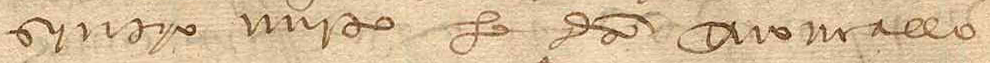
syntyo mujto ho dt̄o guoncallo
